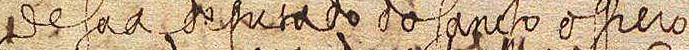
de saa deputado do sancto officio
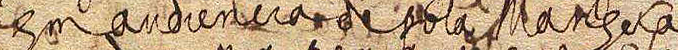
Em audiencia de pola Manhaā
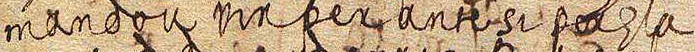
mandou vir perante si por Ela
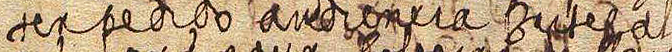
ter pedido audiencia Brites al
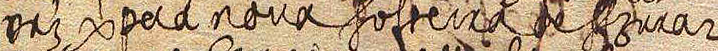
vaz̄ xpaā noua solteira de Azurar
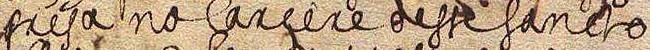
presa no Carcere deste sancto
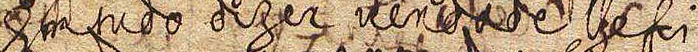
Em tudo dizer uerdade lhe foi
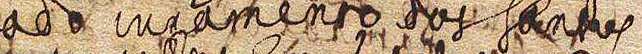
dado iuramento dos santos
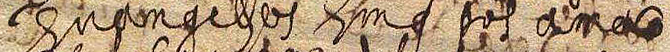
Euangelhos Em q̄ pos a maõ
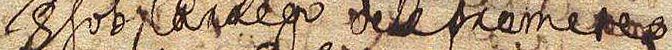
E sob Carrego dele prometeo
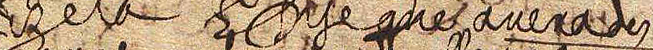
dizela E Dise que auera dez
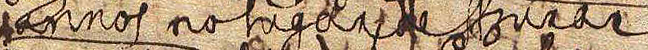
annos no lugar de Azurar
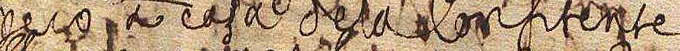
veio de casa dela Confitente
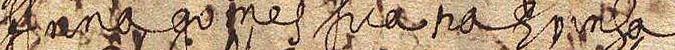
Anna gomes sua tia E vinha
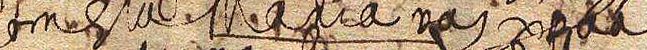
com Ela Maria vaz xpaā
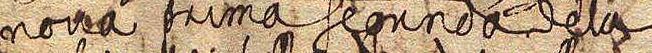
noua prima segunda dela
